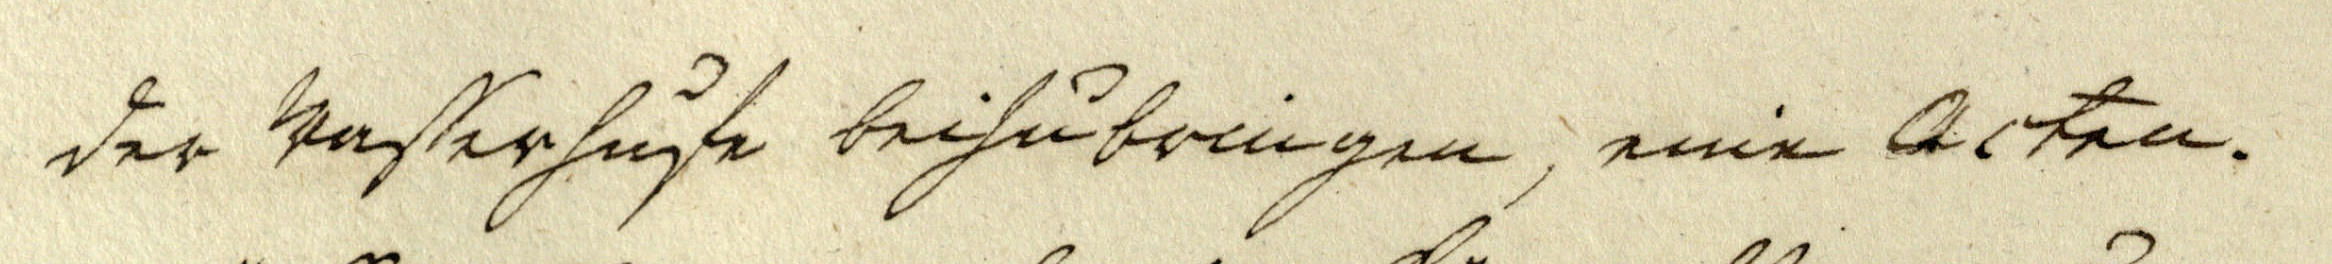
der Wasserhufe beizubringen, eine Acten¬
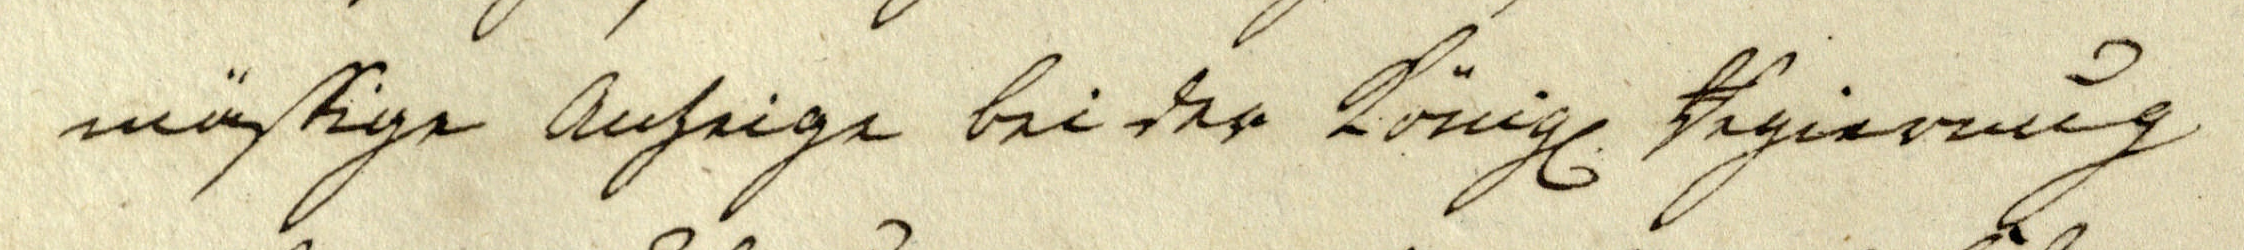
mässige Anzeige bei der Königl. Regierung
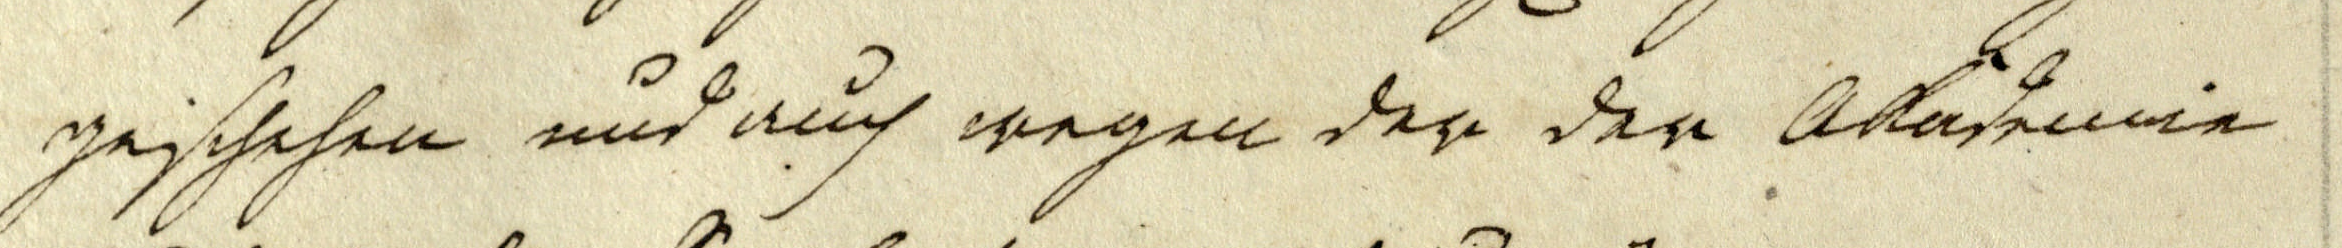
geschehen und auch wegen der der Akademie
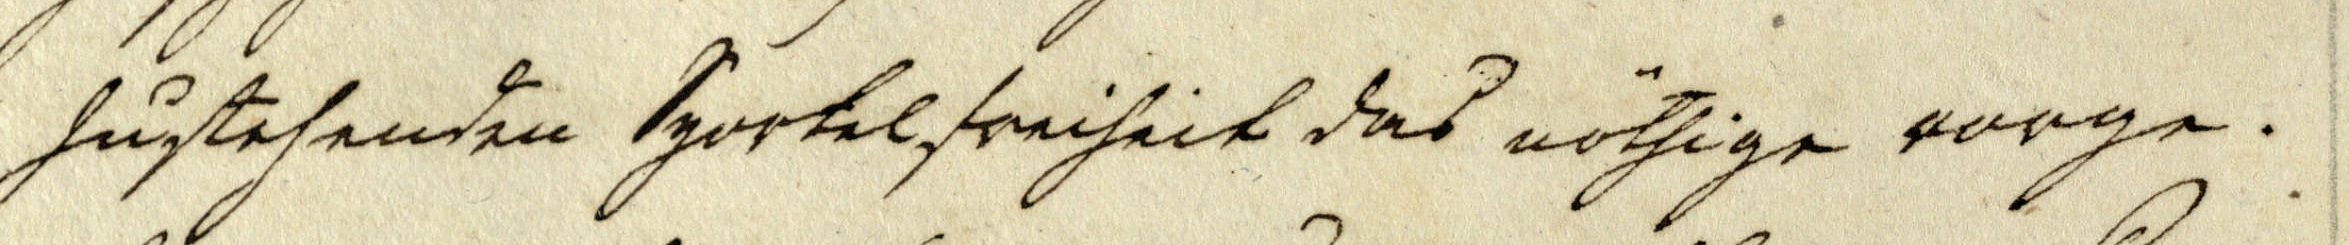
zustehenden Sportelfreiheit das nöthige vorge¬
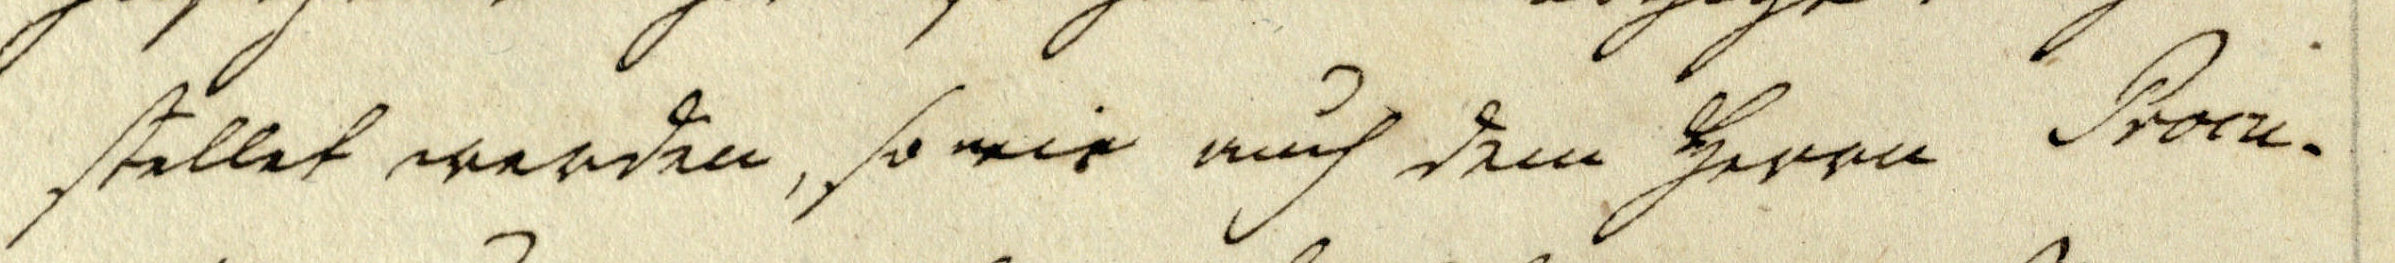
stellet werden, so wie auch dem Herrn Procu¬
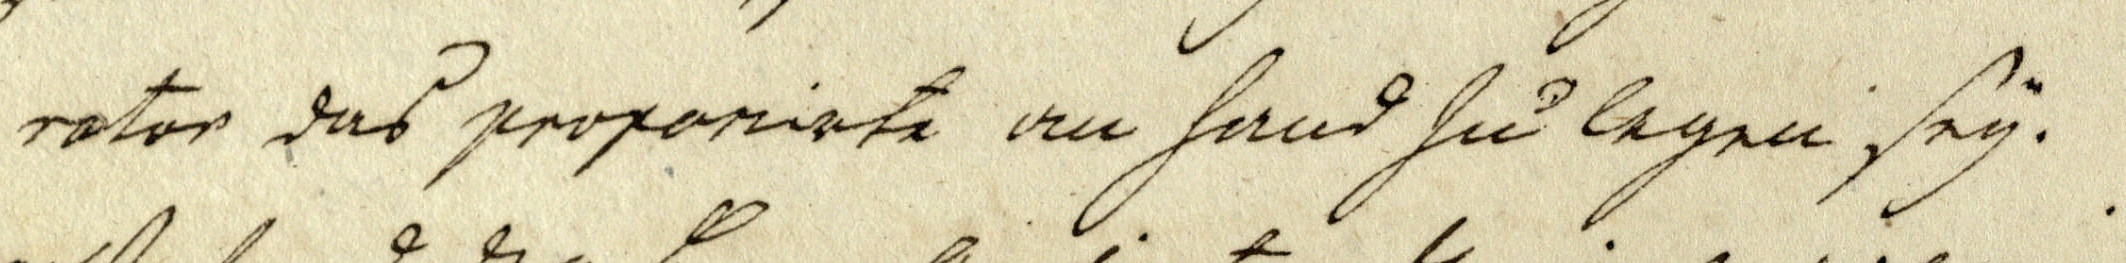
rator das proponirte an Hand zu legen seÿ.
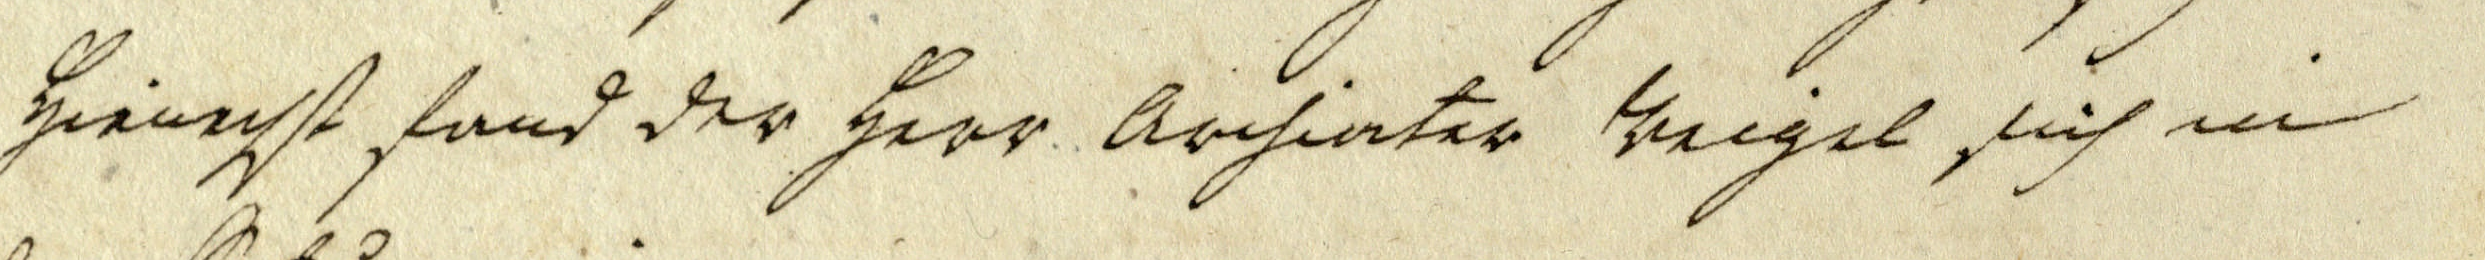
Hienechst fand der Herr Archiater Weigel sich in
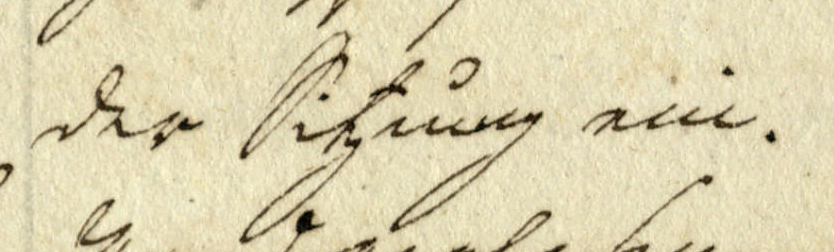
der Sitzung ein.
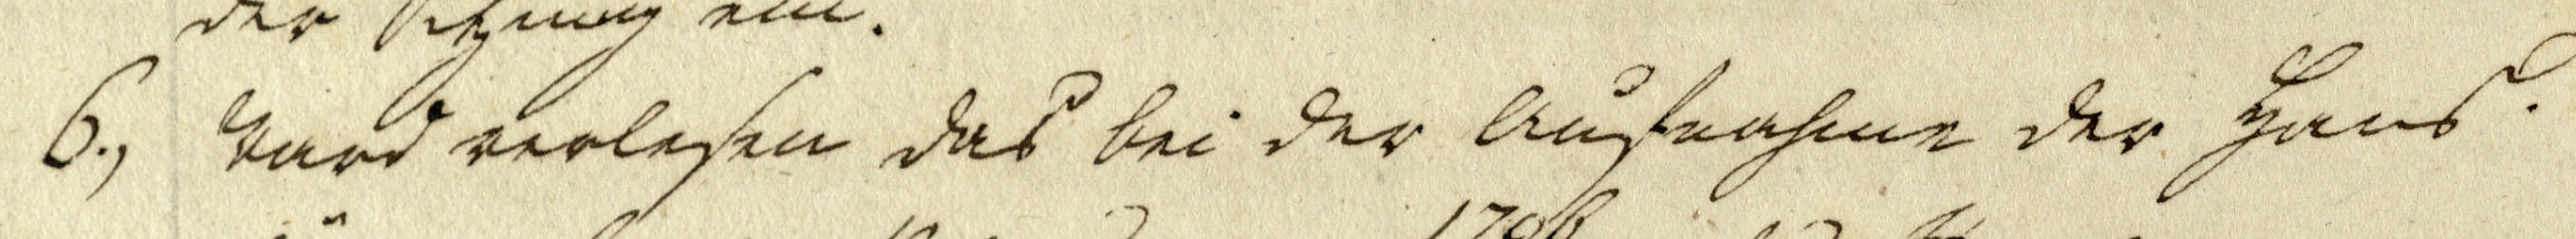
6., Wird verlesen das bei der Aufnahme der Hans¬
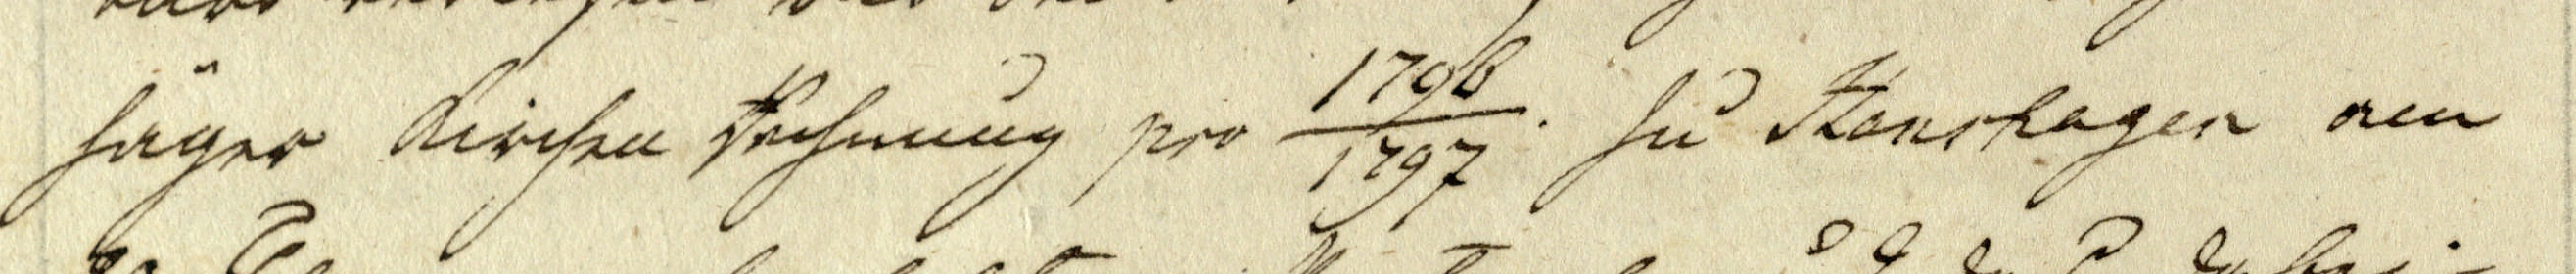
häger Kirchen Rechnung pro 1796/1797 zu Hanshagen am
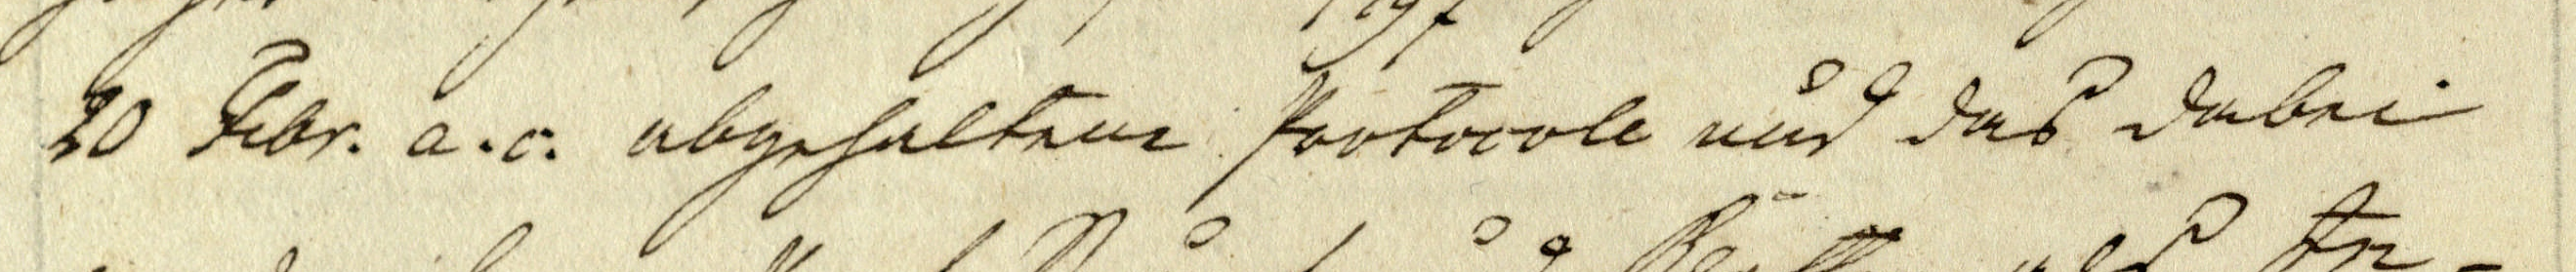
20 Febr. a. c. abgehaltene Protocoll und das dabei
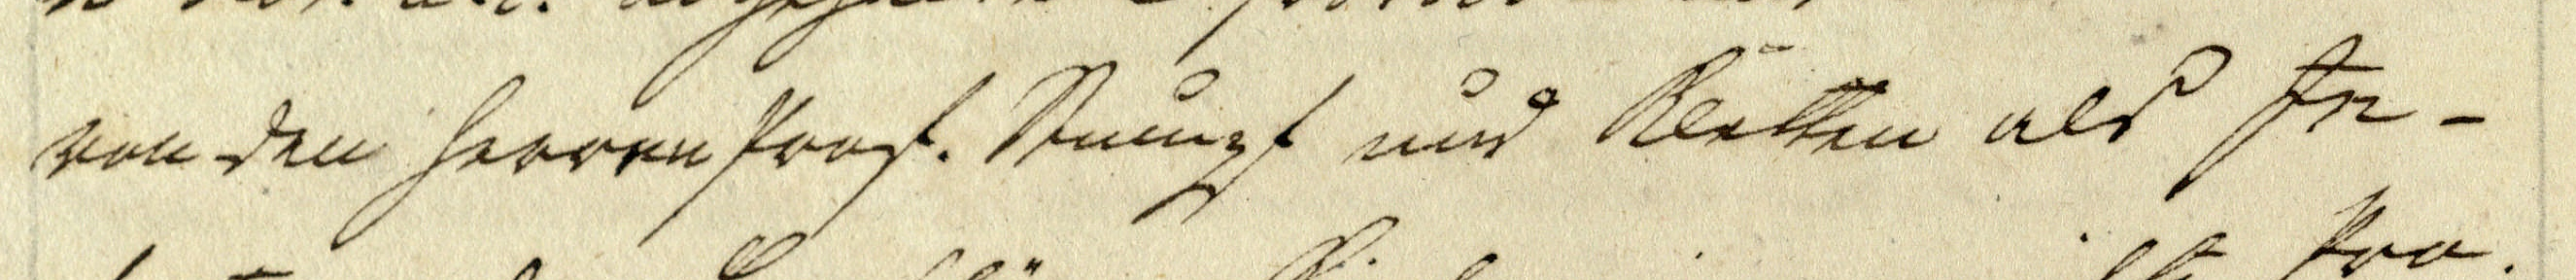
von den Herren Prof. Stumpf und Kletten als In¬
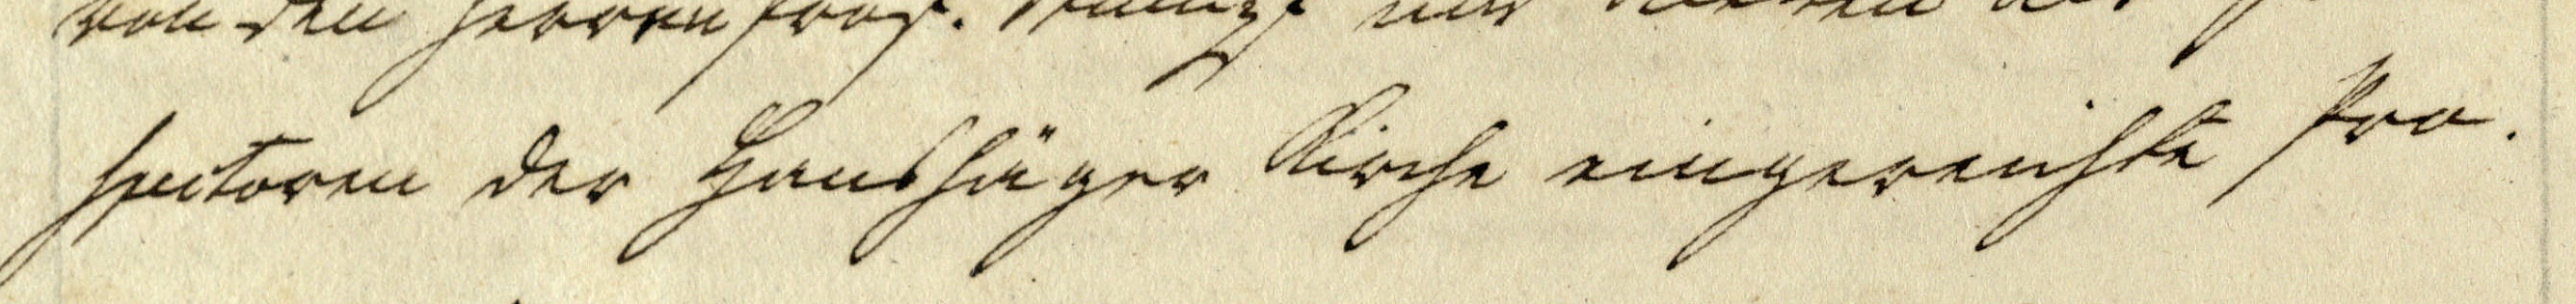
spectoren der Hanshäger Kirche eingereichte Pro¬
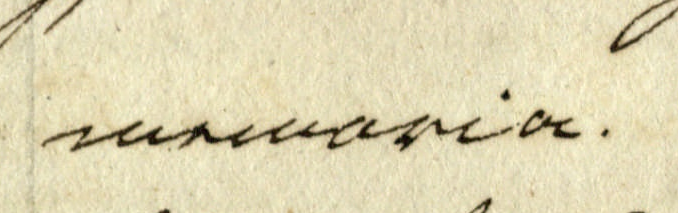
memoria.
